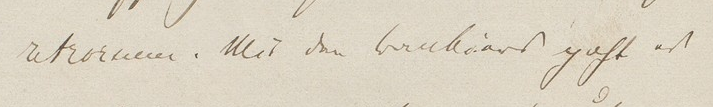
retrorsum. Mit den Bankiers geht es
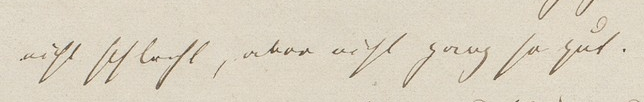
nicht schlecht, aber nicht ganz so gut.
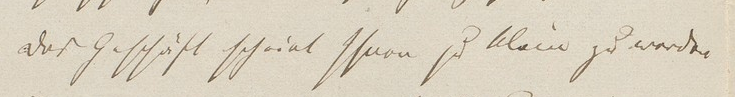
Das Geschäft scheint Ihnen zu klein zu werden.
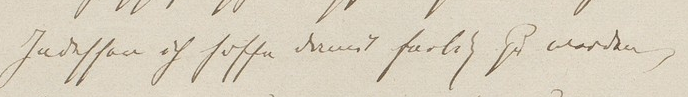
Indessen ich hoffe damit fertig zu werden,
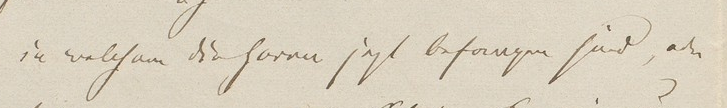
in welchem die Herrn jezt befangen sind, ein
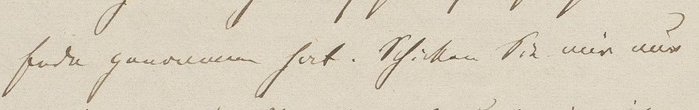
Ende genommen hat. Schicken Sie mir nur
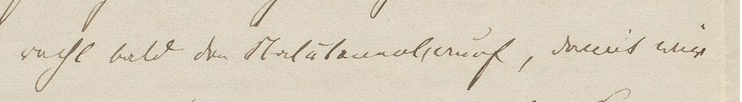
recht bald den Statutenentwurf, damit wir
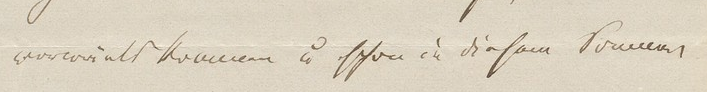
vorwärts kommen u schon in diesem Sommer
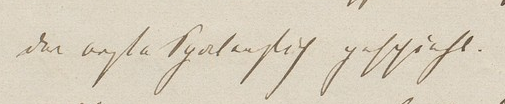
der erste Spatenstich geschieht.
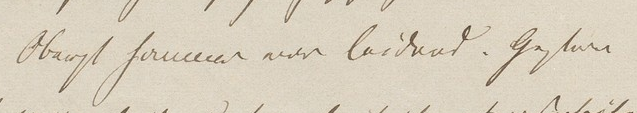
Oberst Hammer war leidend. Gestern
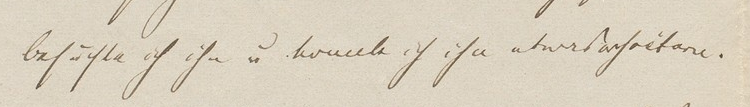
besuchte ich ihn u konnte ich ihn etwas erheitern.
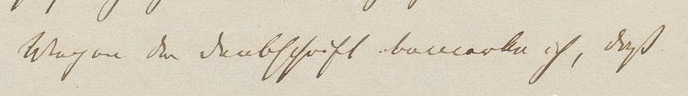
Wegen der Denkschrift bemerke ich, daß
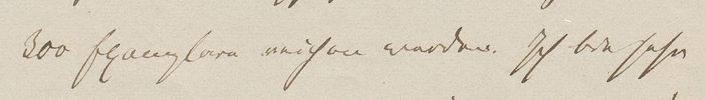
300 Exemplare reichen werden. Ich bin sehr
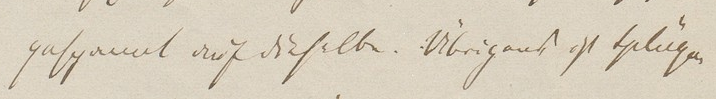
gespannt auf dieselbe. Übrigens ist Splügen
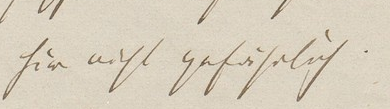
hier nicht gefährlich.
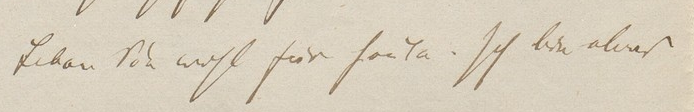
Leben Sie wohl für heute. Ich bin etwas
